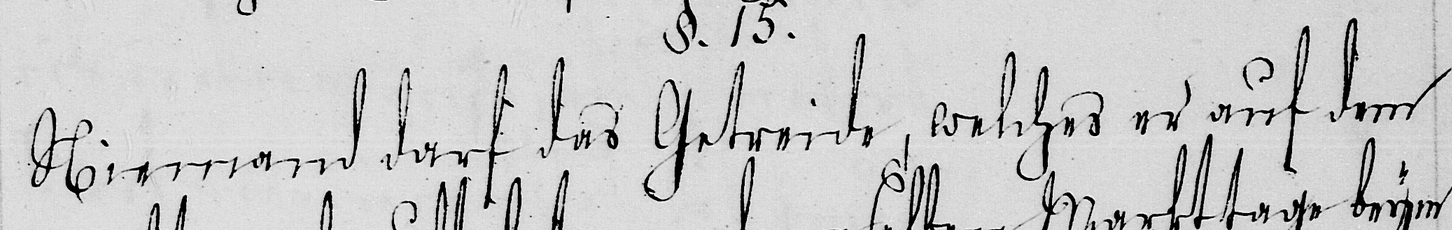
Niemand darf das Getreide, welches er auf dem
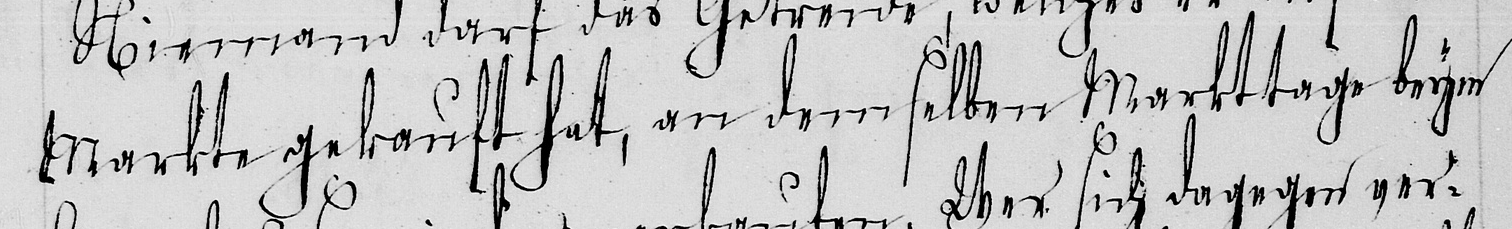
Markte gekauft hat, an demselben Markttage beym
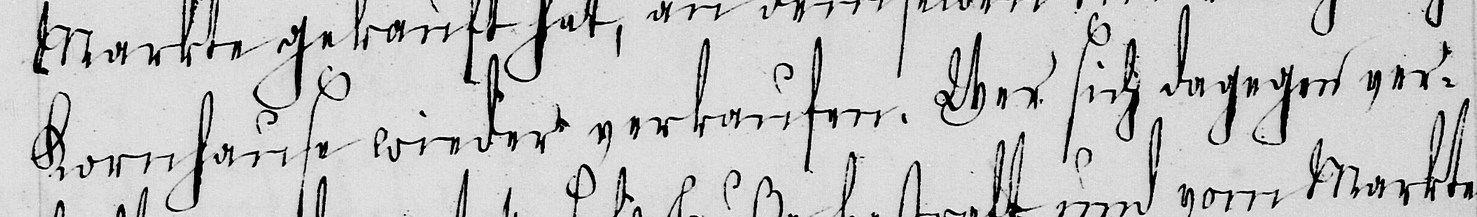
Kornhause wieder verkaufen. Wer sich dagegen ver¬
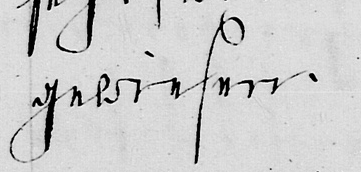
gewiesen.
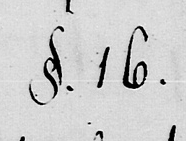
§. 16.
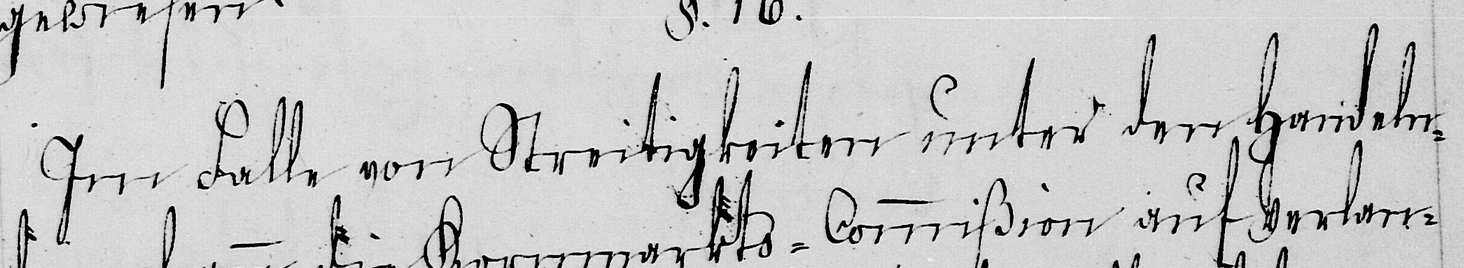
Im Falle von Streitigkeiten unter den Handeln¬
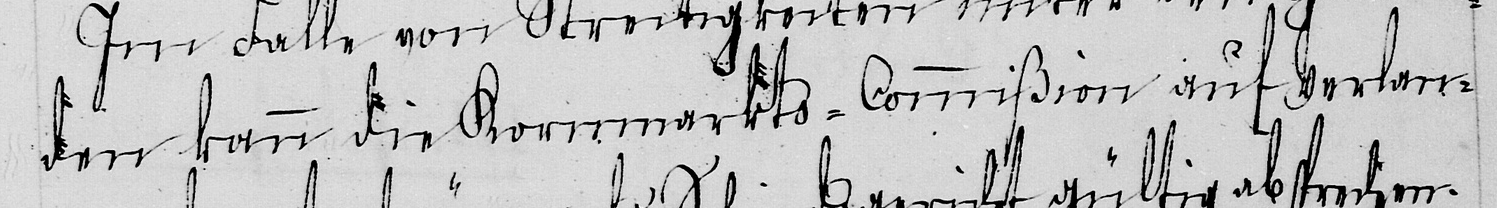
den kann die Kornmarkts-Commißion auf Verlan¬
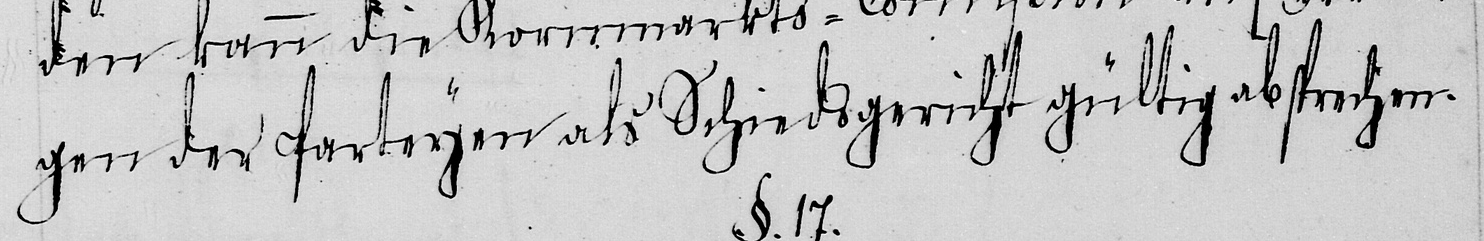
gen der Parteyen als Schiedsgericht gültig absprechen.
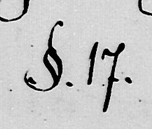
§. 17.
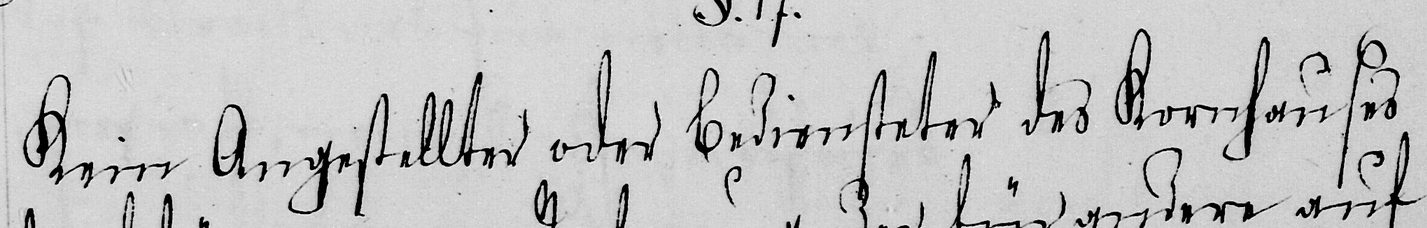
Kein Angestellter oder Bediensteter des Kornhauses
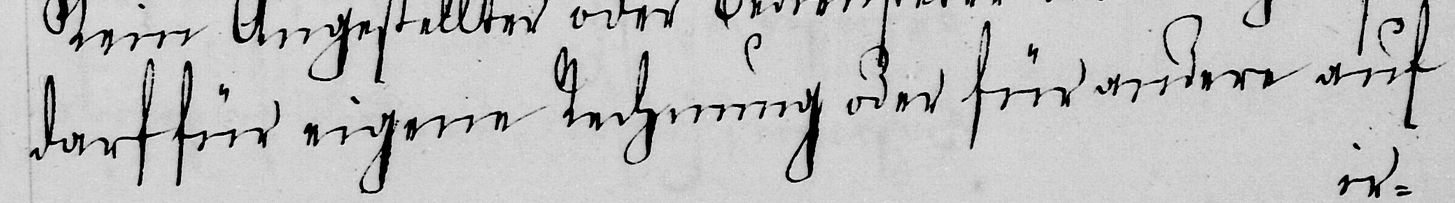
darf für eigene Rechnung oder für andere auf
